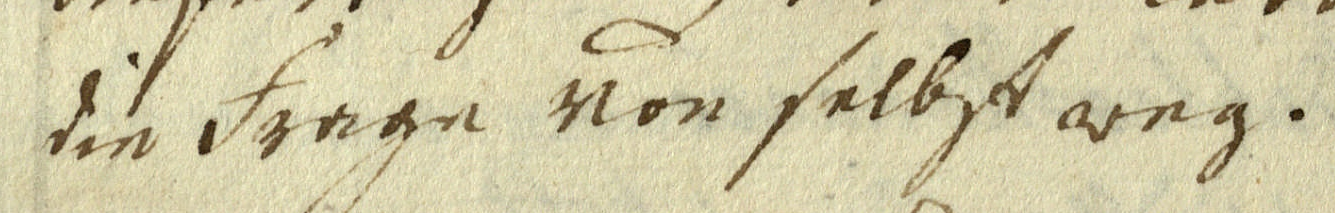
die Frage von selbst weg.
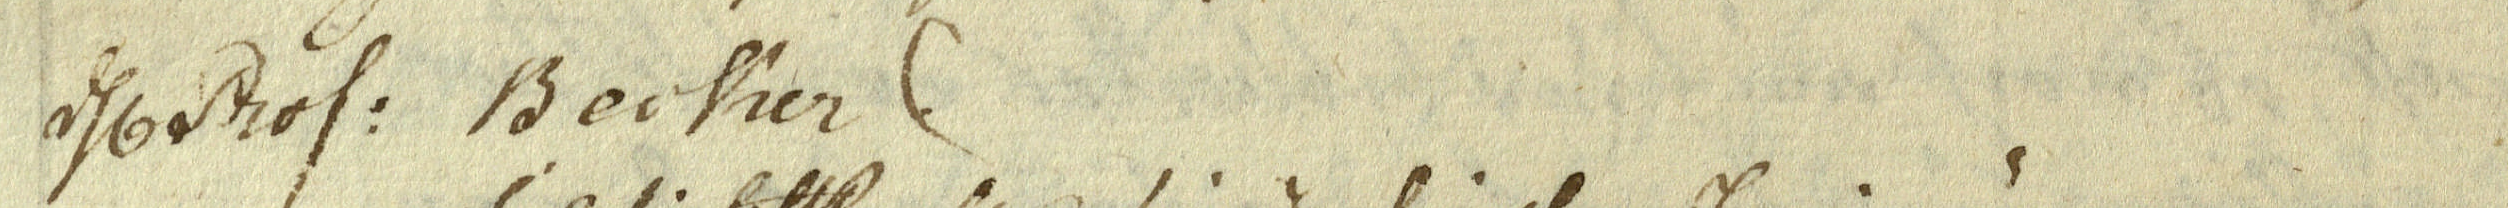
dh Prof. Becker
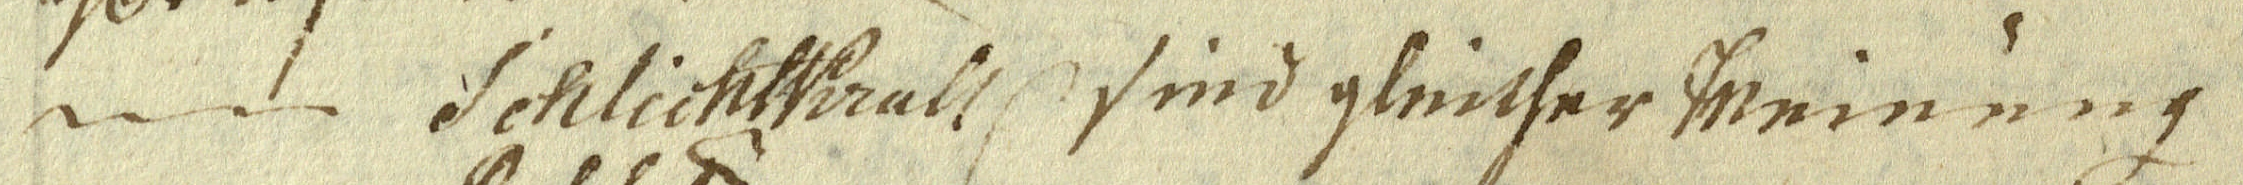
Schlichtkrull sind gleicher Meinung
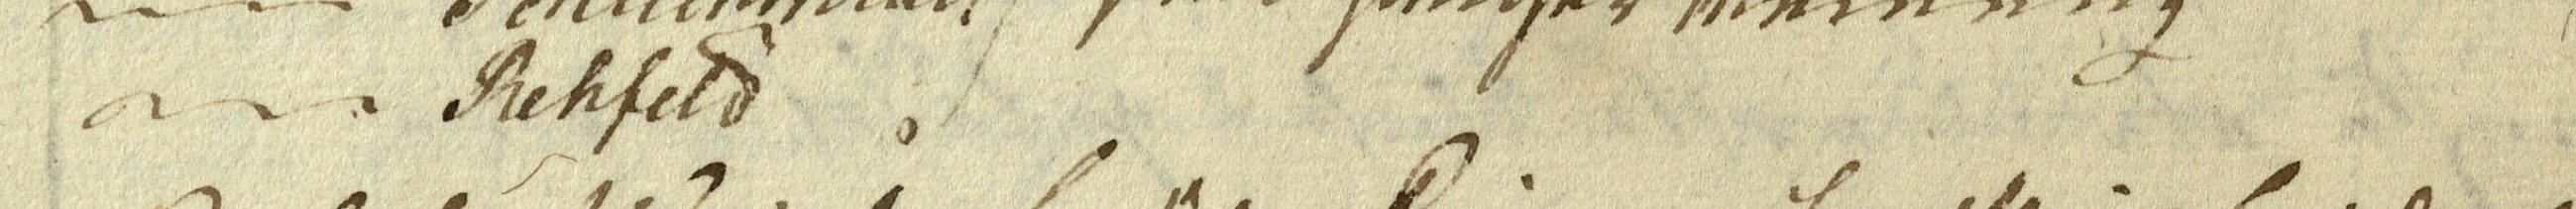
Rehfeld
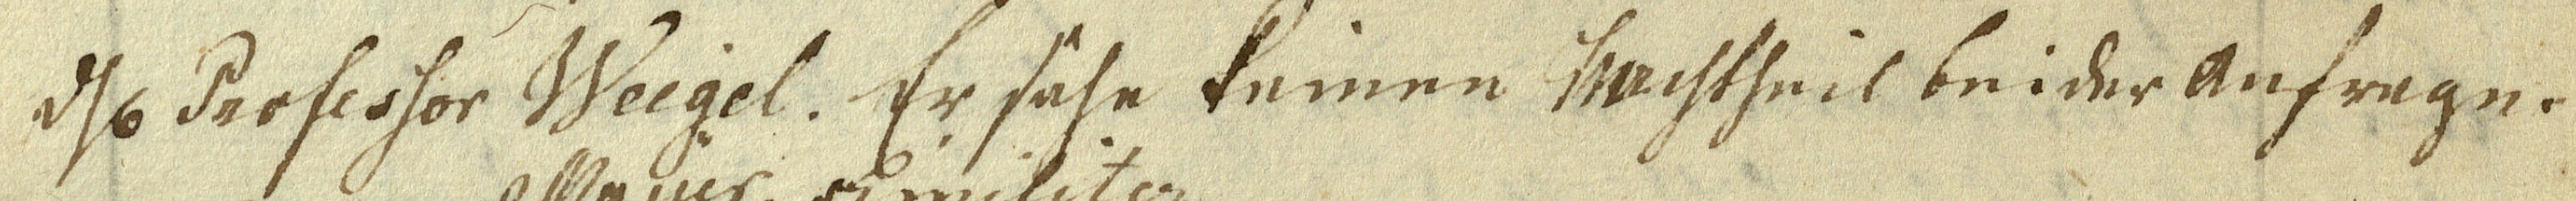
dh Professor Weigel. Er sähe keinen Nachtheil bei der Anfrage.
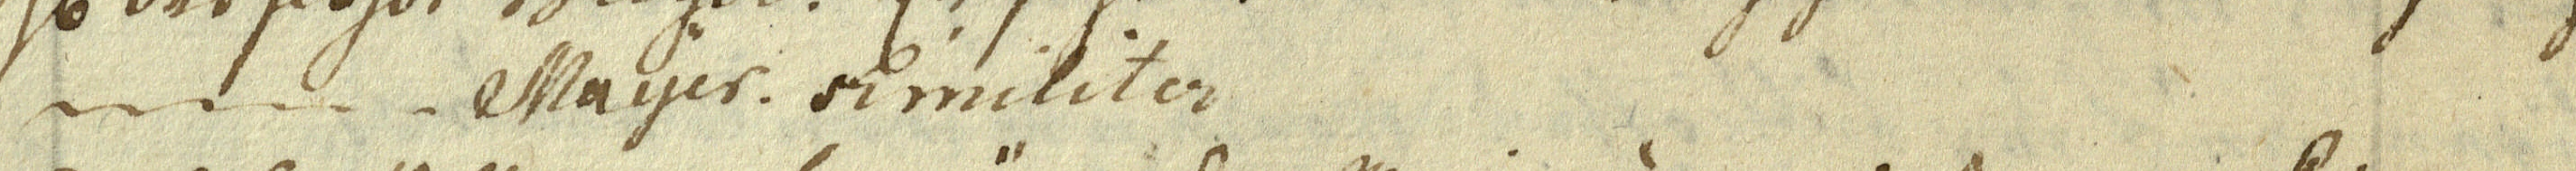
Maÿer similiter
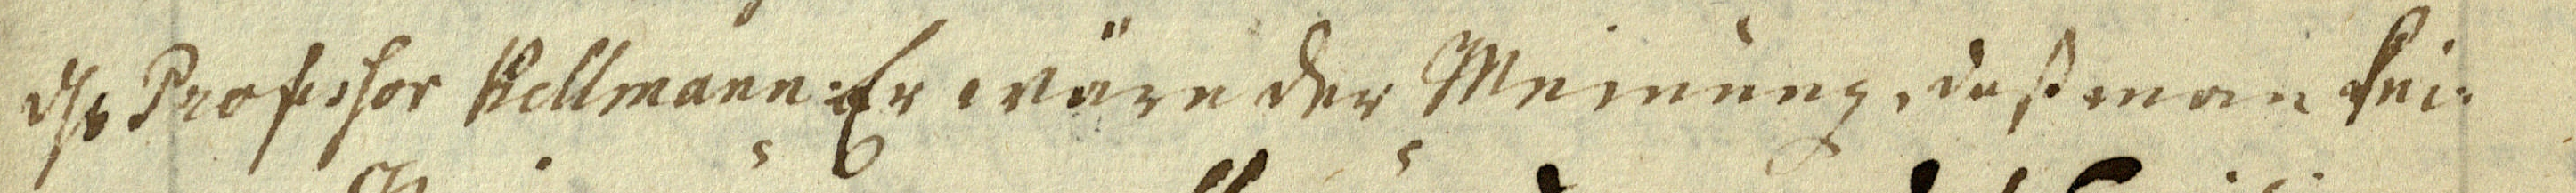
dh Professor Kellmann. Er wäre der Meinung, daß man kei¬
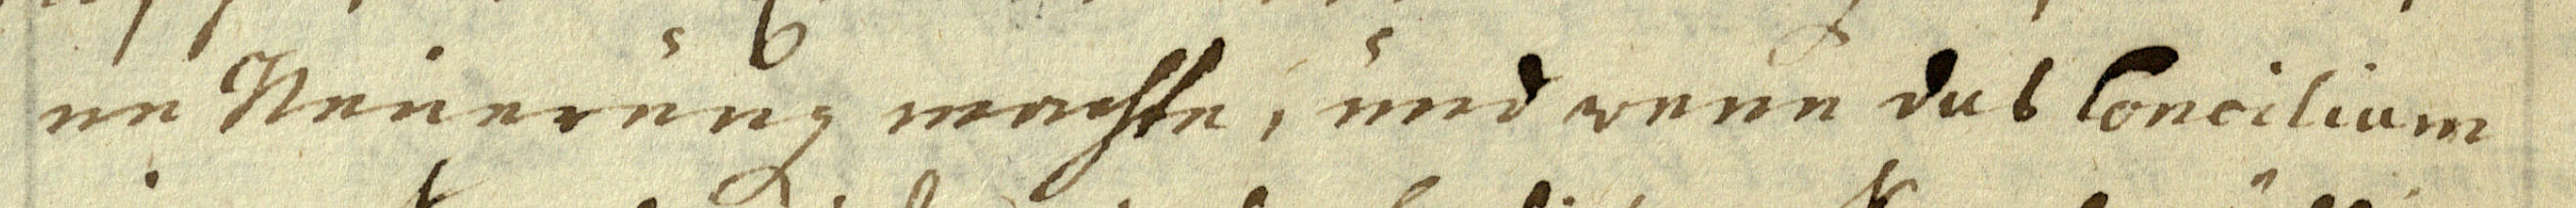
ne Neuerung machte, und wenn das Concilium
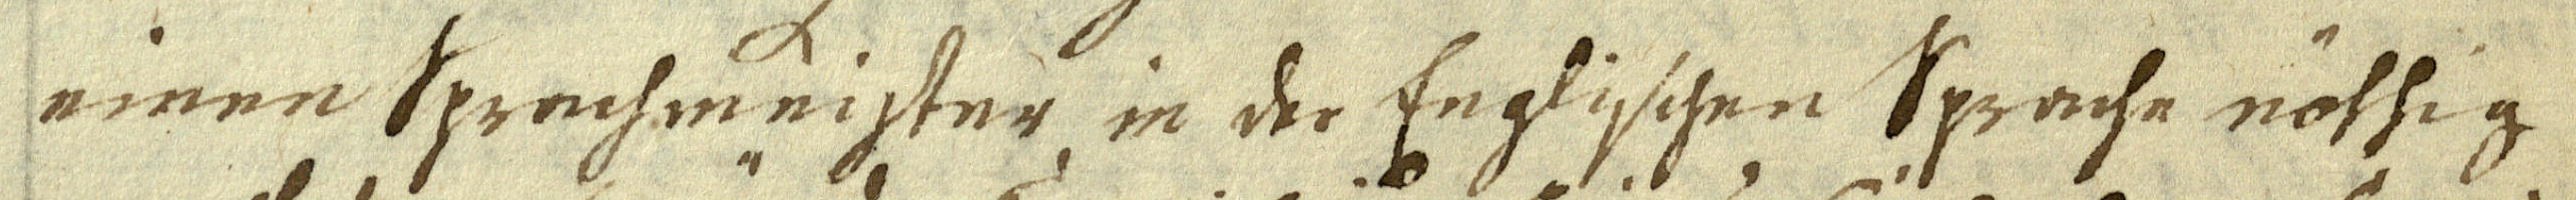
einen Sprachmeister in der Englischen Sprache nöthig
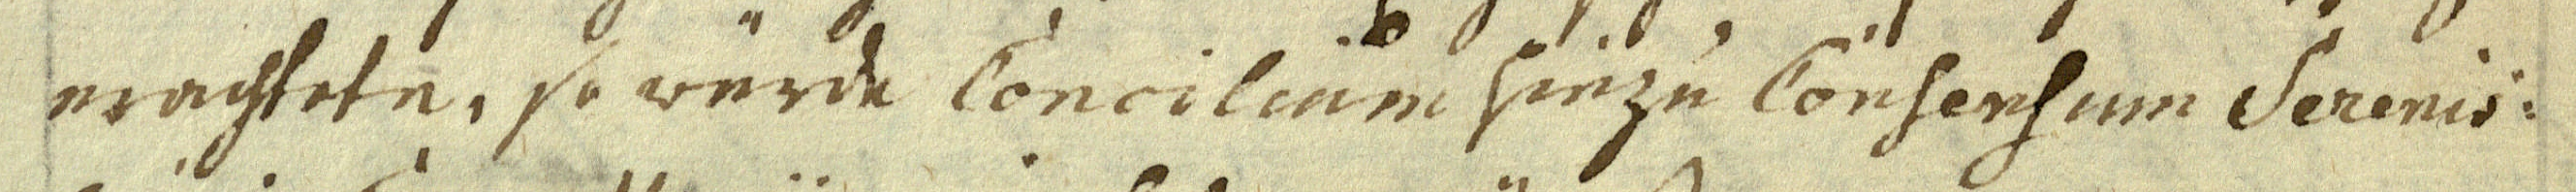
erachtete, so würde Concilium hiezu Consensum Serenis¬
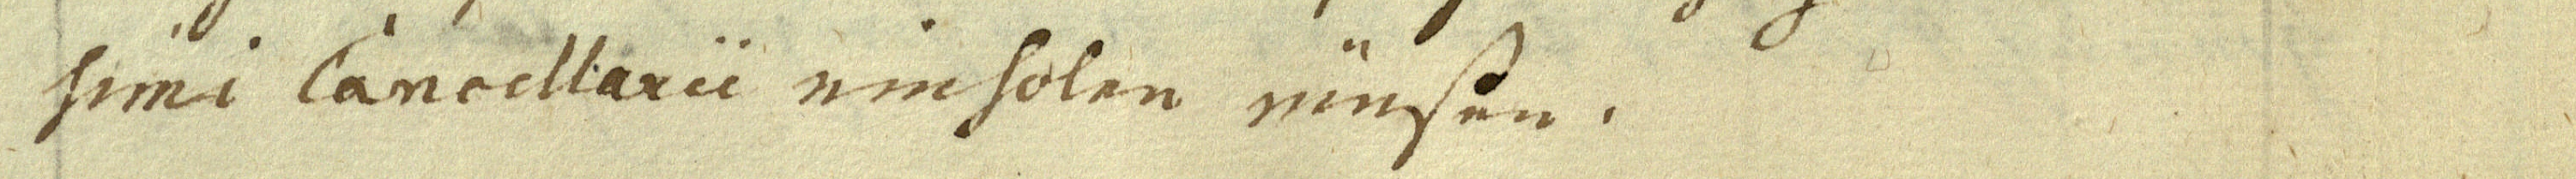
simi Cancellarii einholen müßen.
